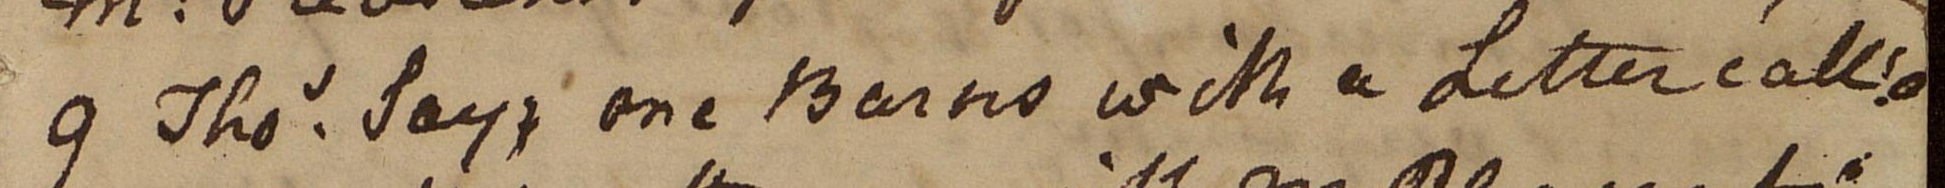9 Tho^s. Says one Barns with a Letter call'd
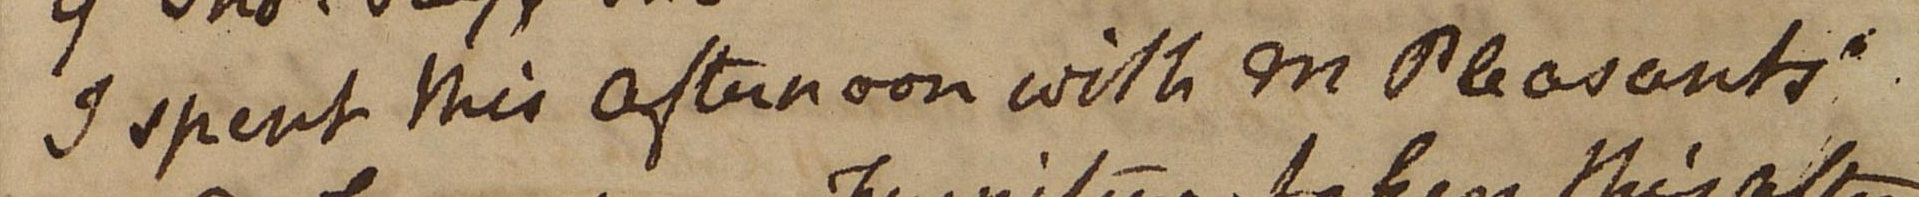I spent this afternoon with M Pleasants
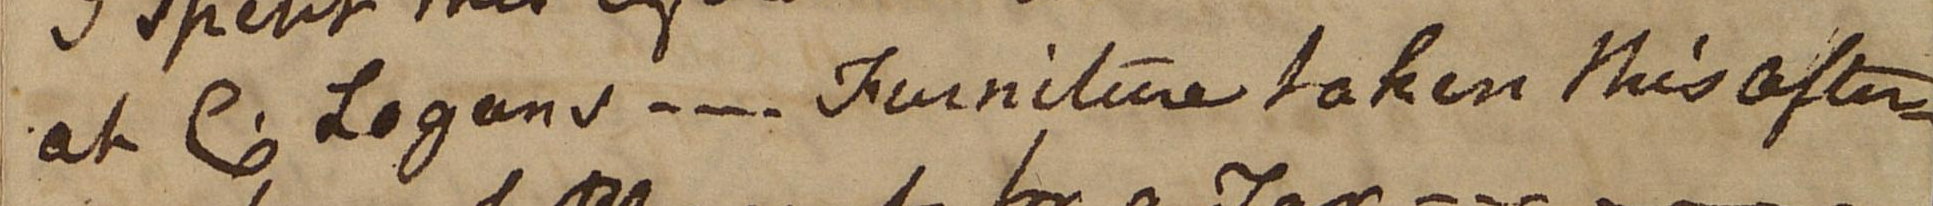at C. Logans-- Furniture taken this after-
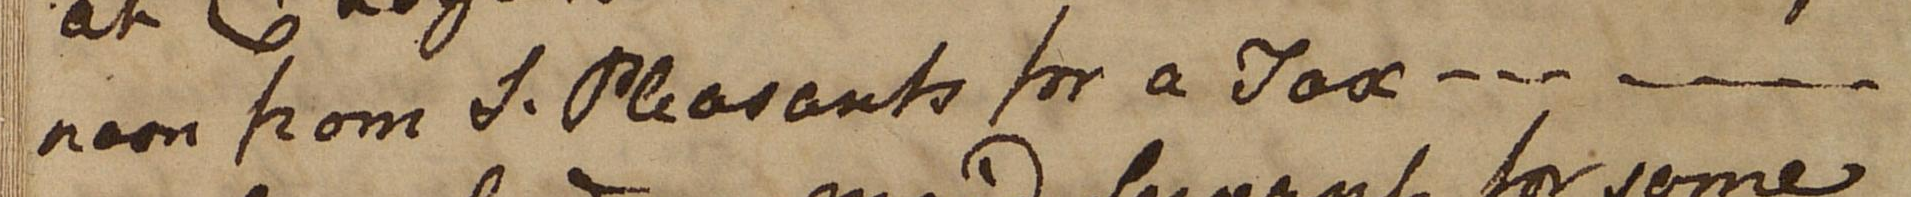noon from S. Pleasants for a T ax-- -
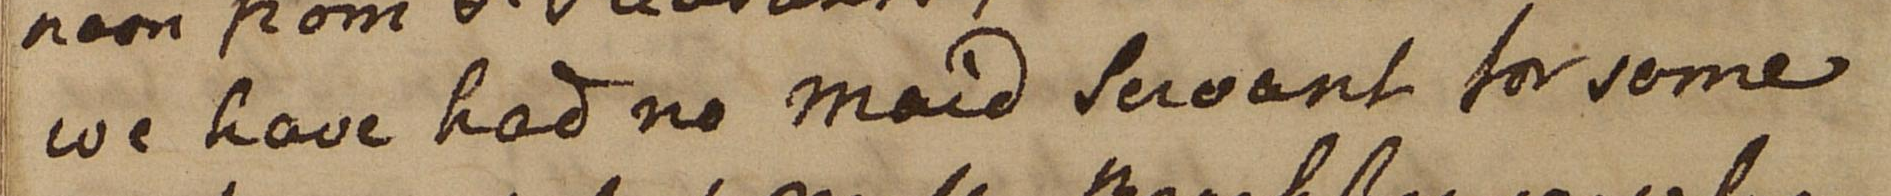we have had no maid servant for some
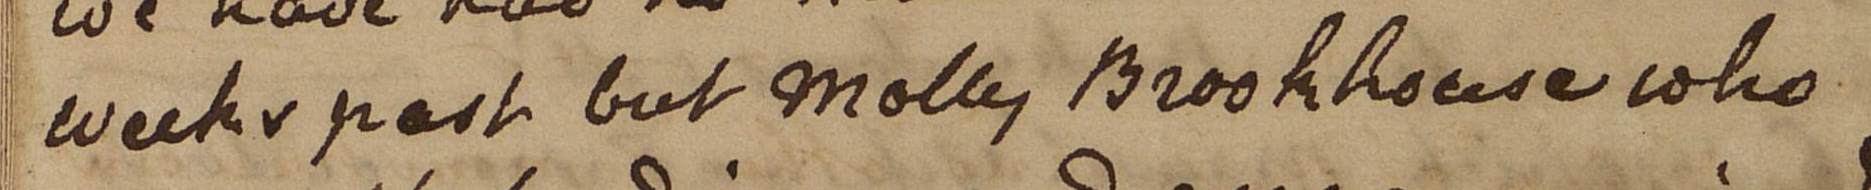weeks past but Molly Brookhsuse who
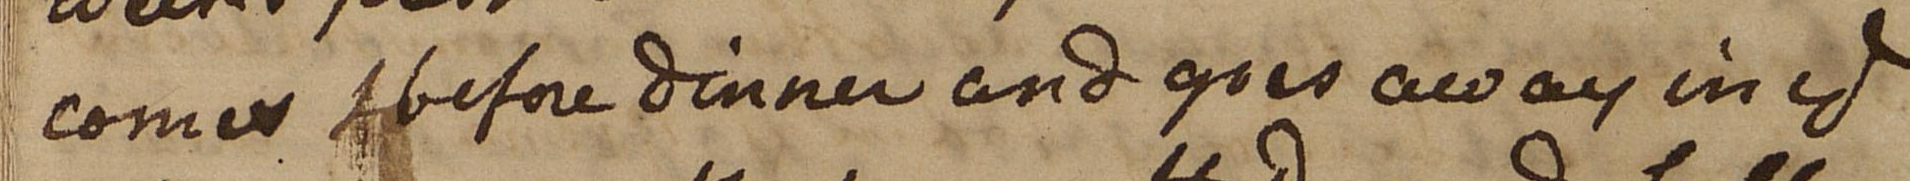comes before dinner and goes away in y^e
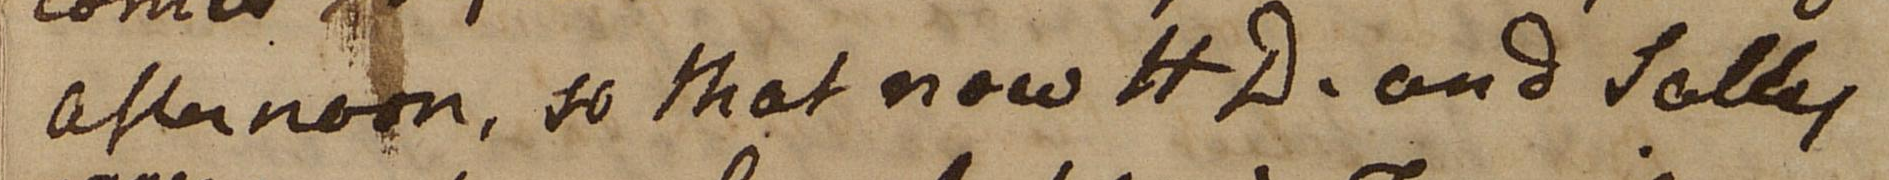afternoon, so that now HD. and Sally
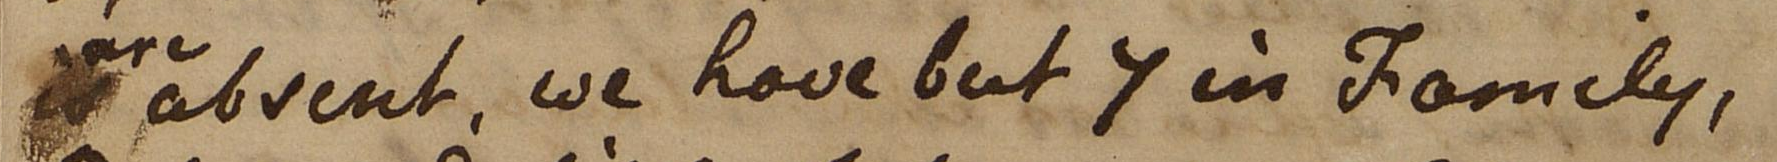^are absent, we have but 4 in Family,
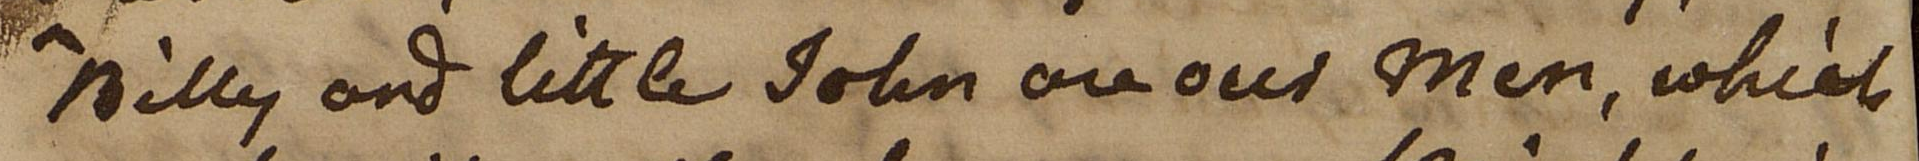Billy and little John are our Men, which
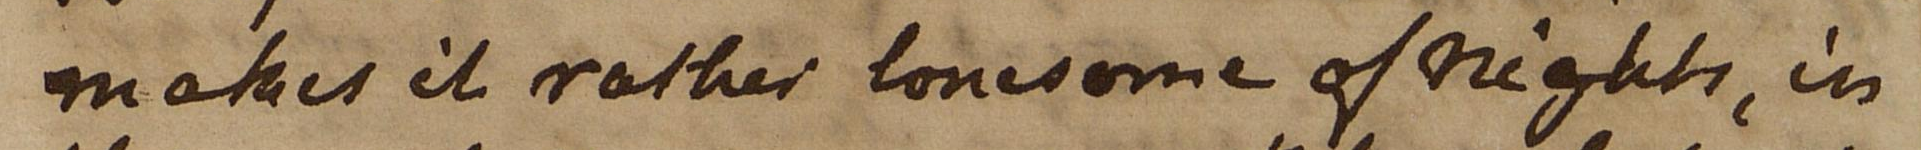makes it rather lonesome of nights, in
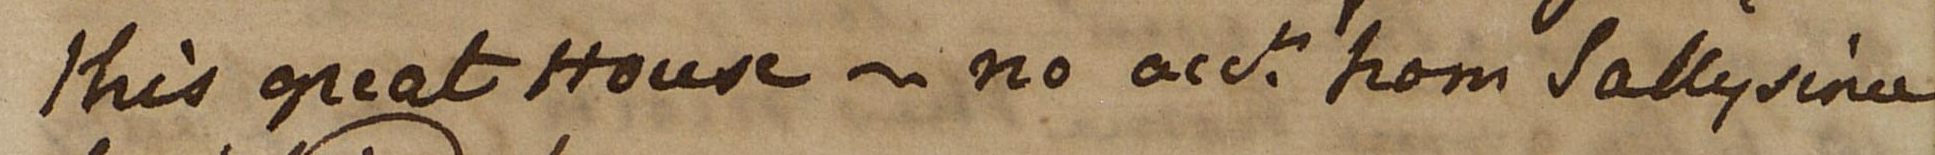this great House- no acc^t. from Sally since
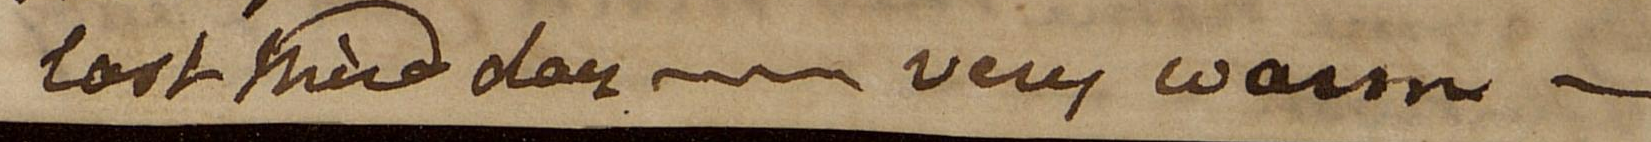last third day- very warm-
